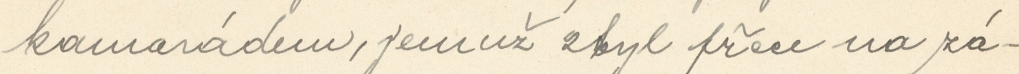kamarádem, jemuž zbyl přece na zá-
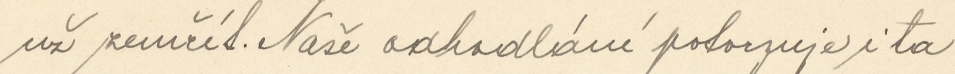už zemřít. Naše odhodlání potvrzuje i ta
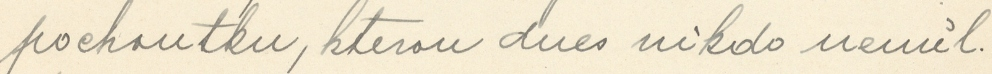pochoutku, kterou dnes nikdo neměl.
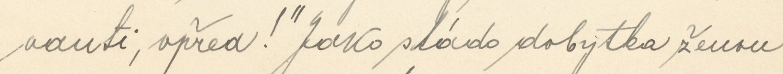vanti, vpřed! Jako stádo dobytka ženou
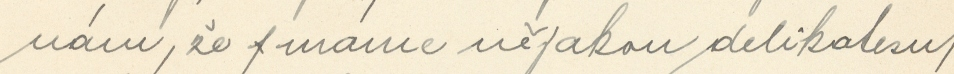nám, že máme nějakou delikatesu,
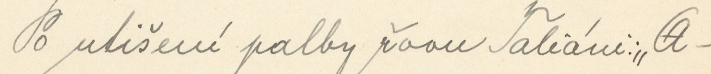Po utišení palby řvou Taliáni: „A-
